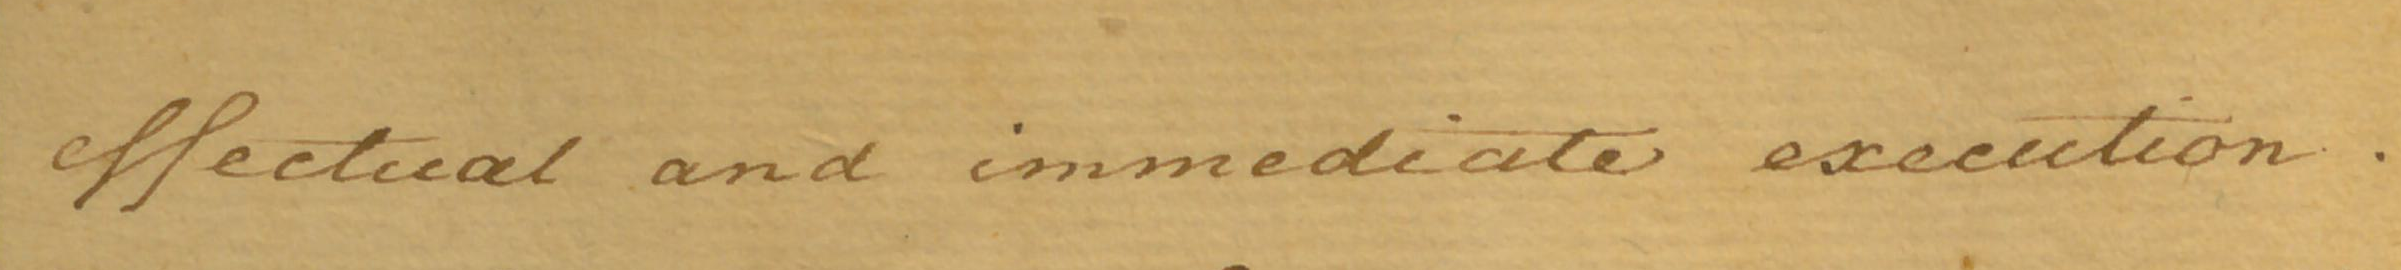effectual and immediate execution.
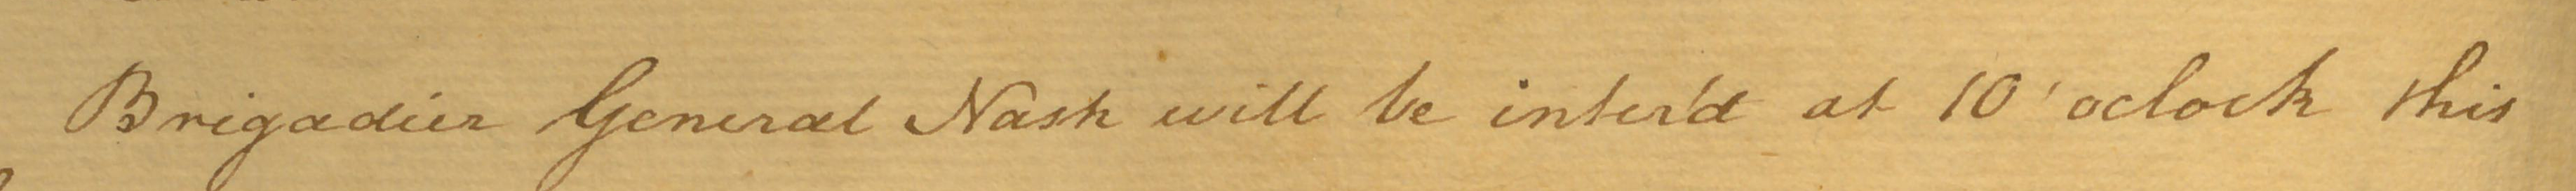Brigadier General Nash will be inter'd at 10 oclock this
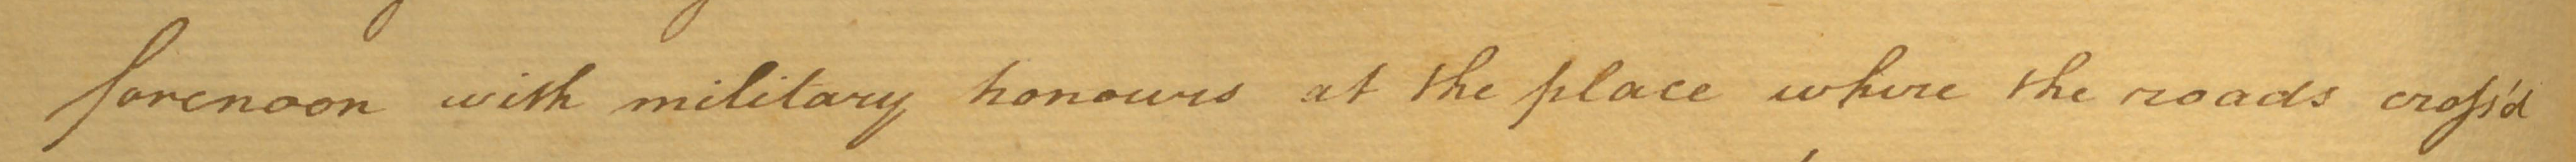forenoon with military honours at the place where the roads cross'd
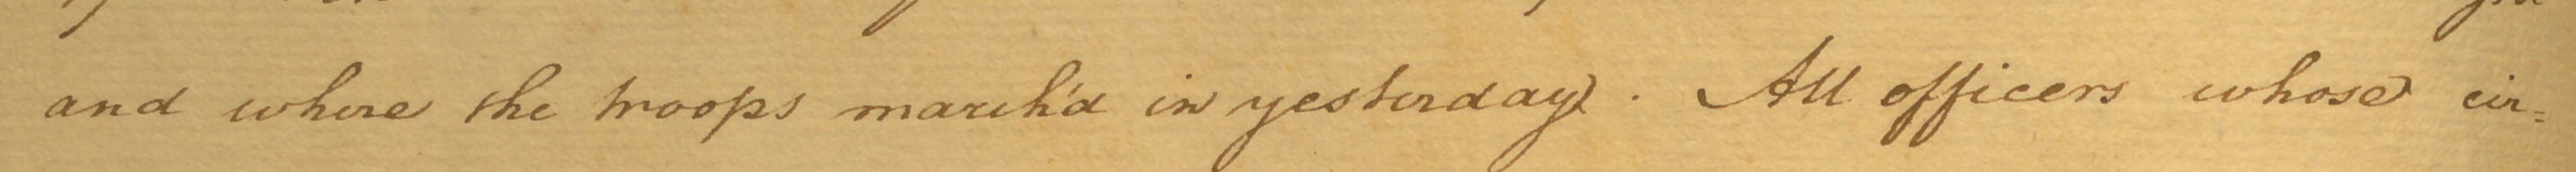and where the troops march'd in yetserday. All officers whose cir-
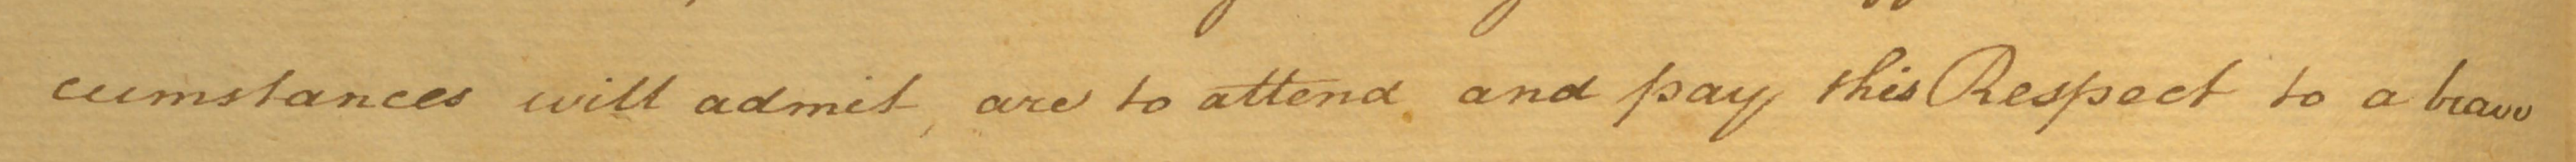cumstances will admit are to attend and pay this Respect to a brave
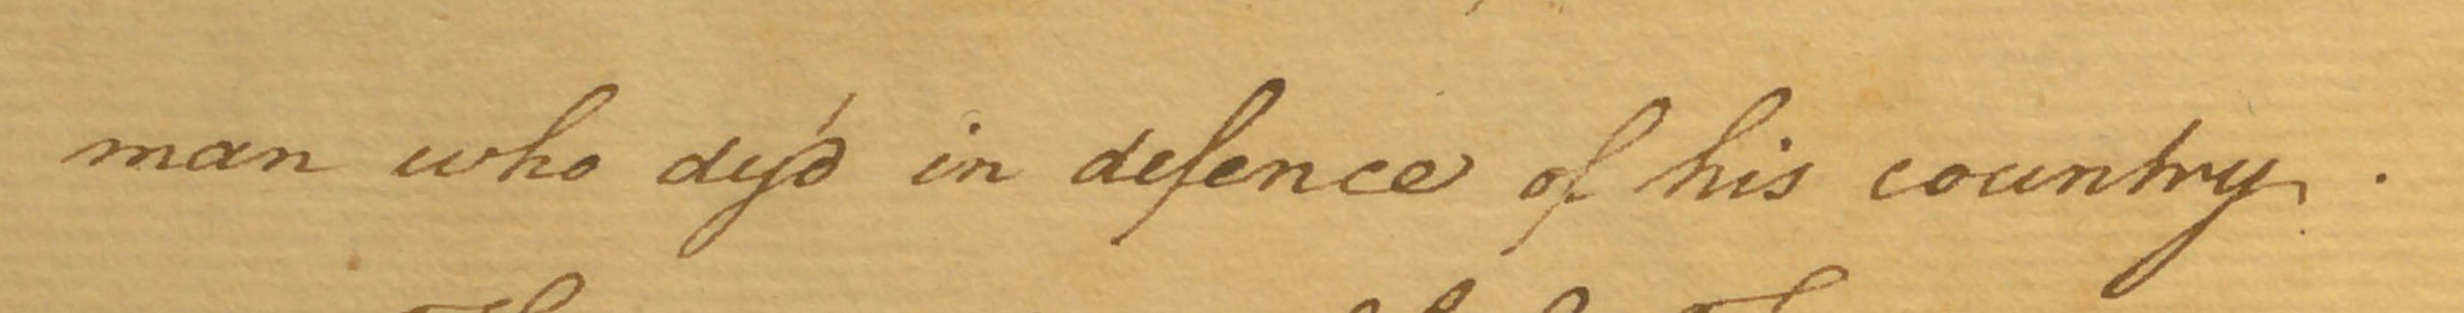man who dy'd in defence of his country.
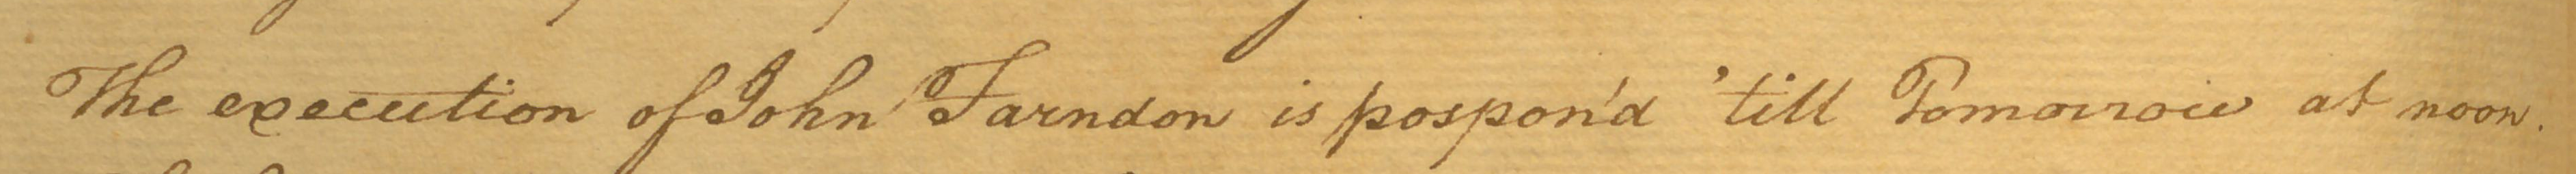The execution of John Farndon is pospon'd till Tomorrow at noon.
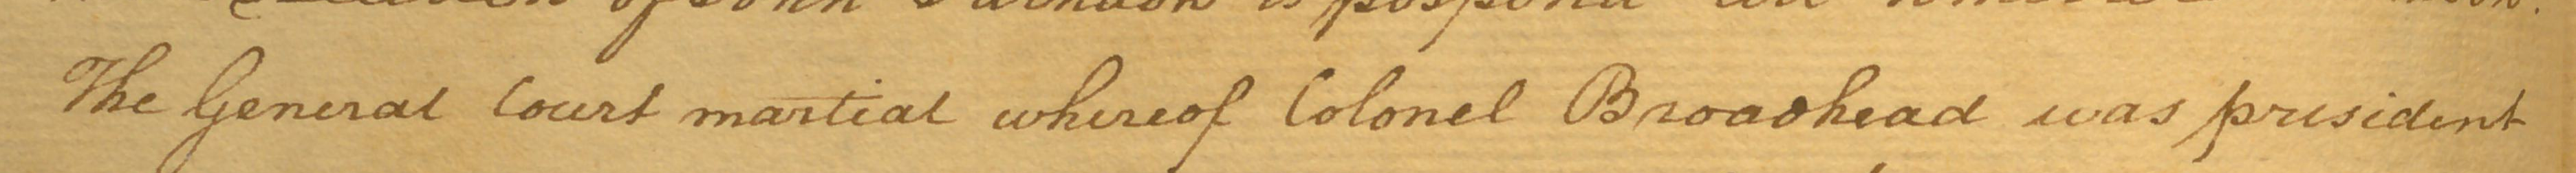The General Court martial whereof Colonel Broadhead was president
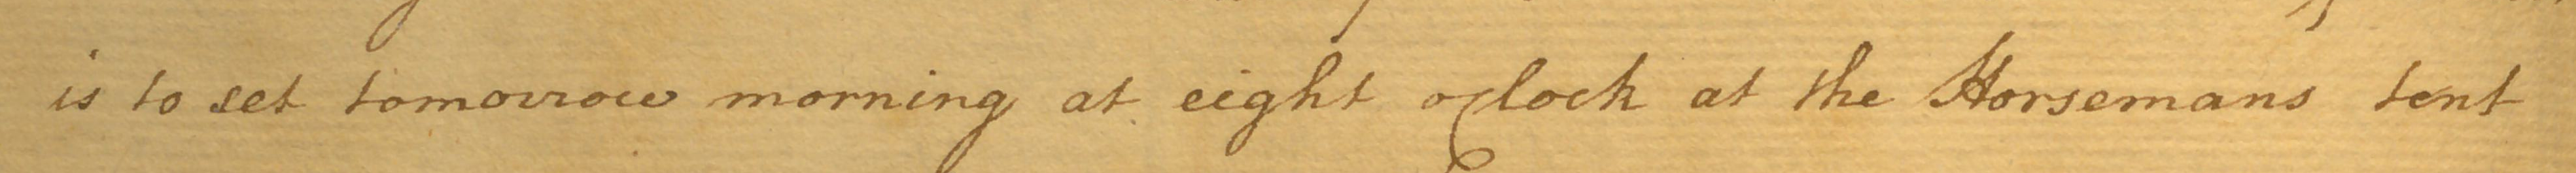is to set tomorrow morning at eight oClock at the Horsemans tent
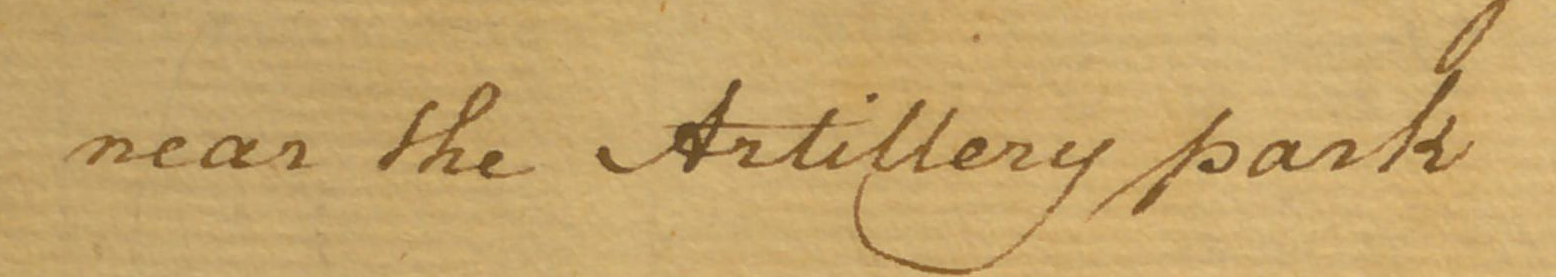near the Artillery park
